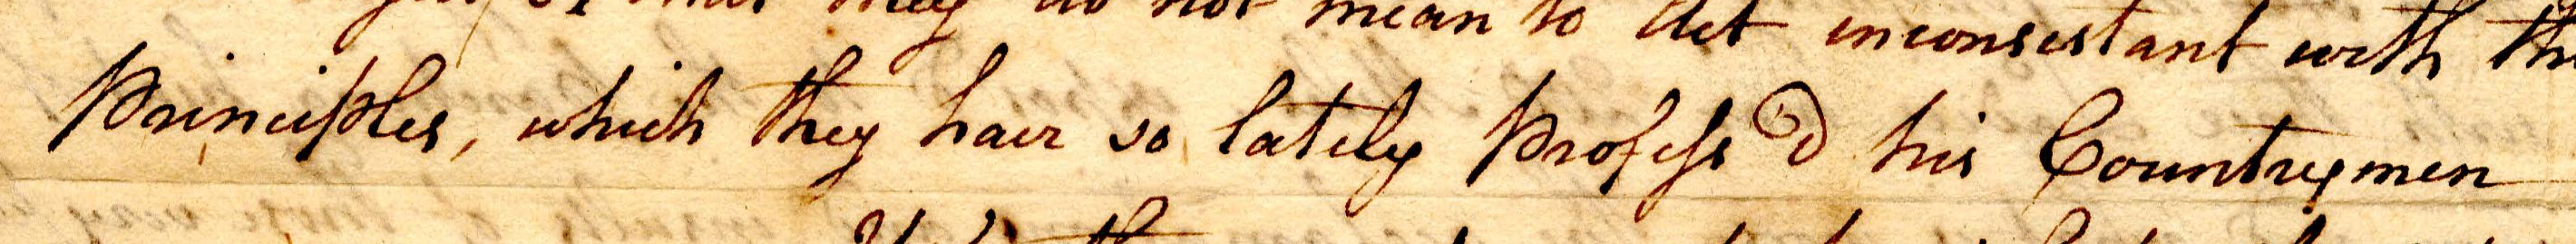Principles, which they have so lately profess'd his Countrymen
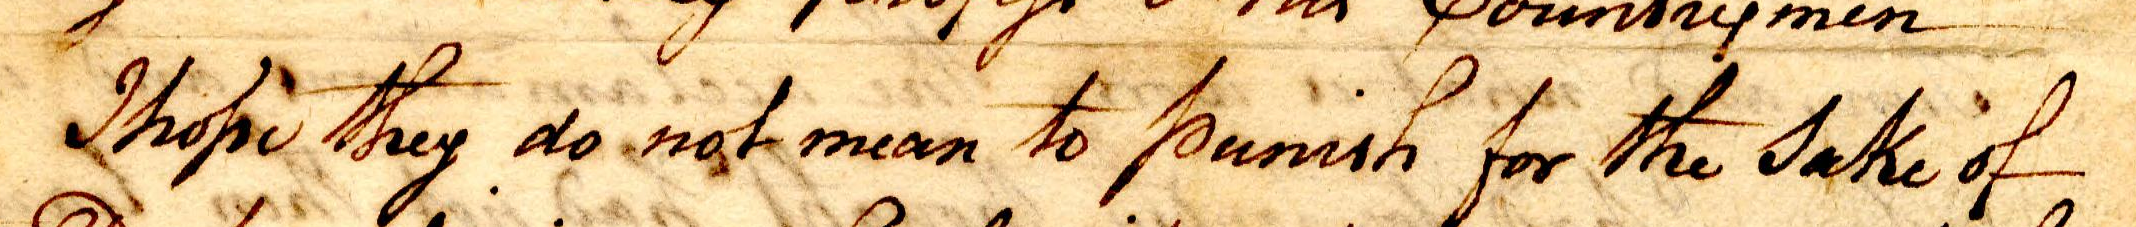hope they do not mean to punish for the Sake of
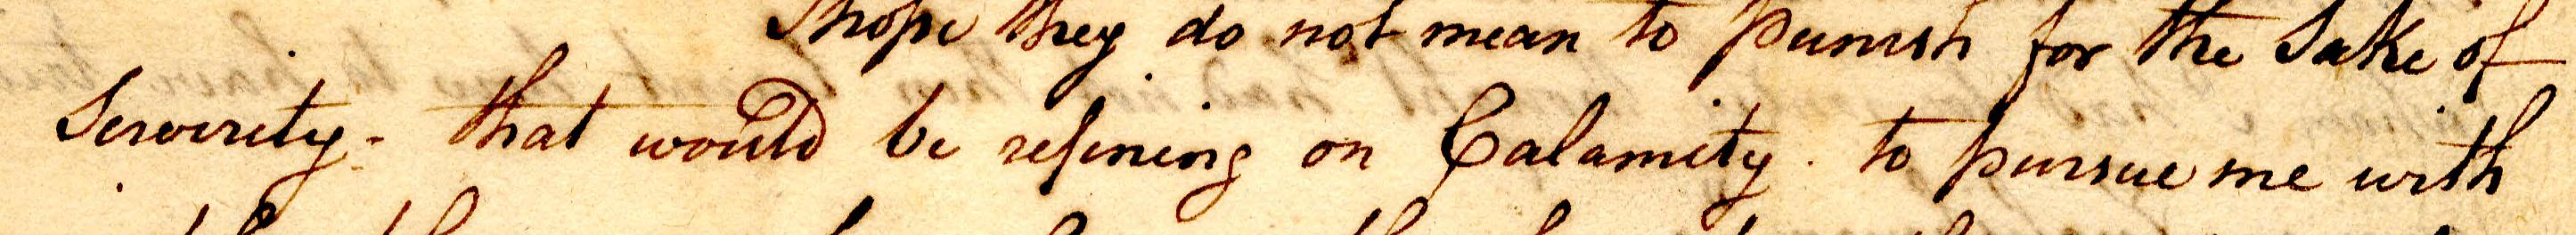Serverity. that would be refining on Calamity. to pursue me with
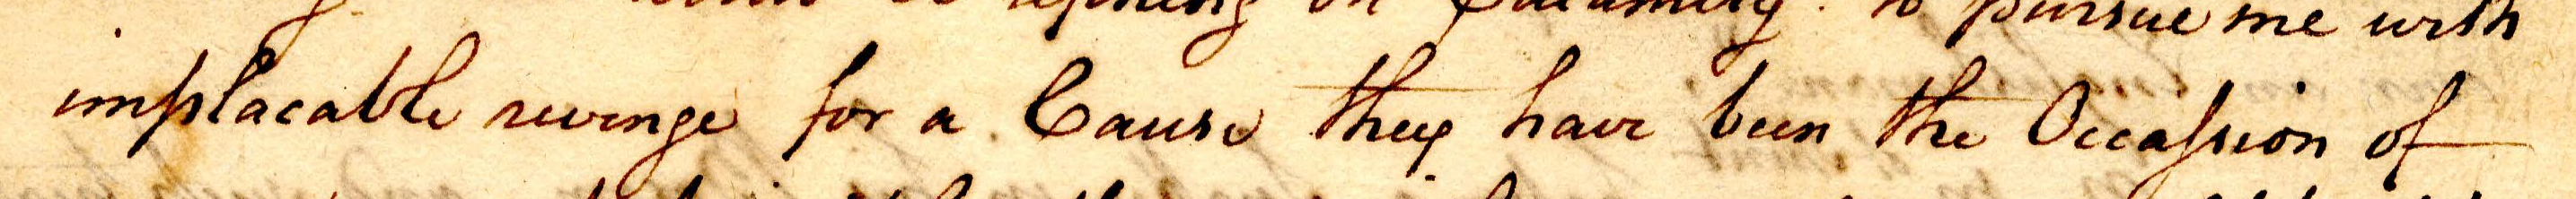implacable revenge for a Cause they have been the Occassion of
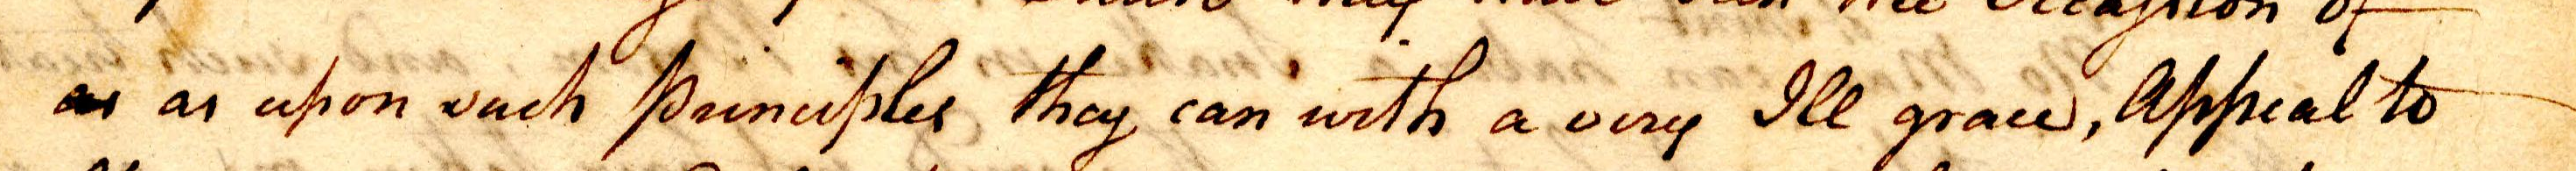as as upon sack principles they can with a very Ill grace, Appeal to
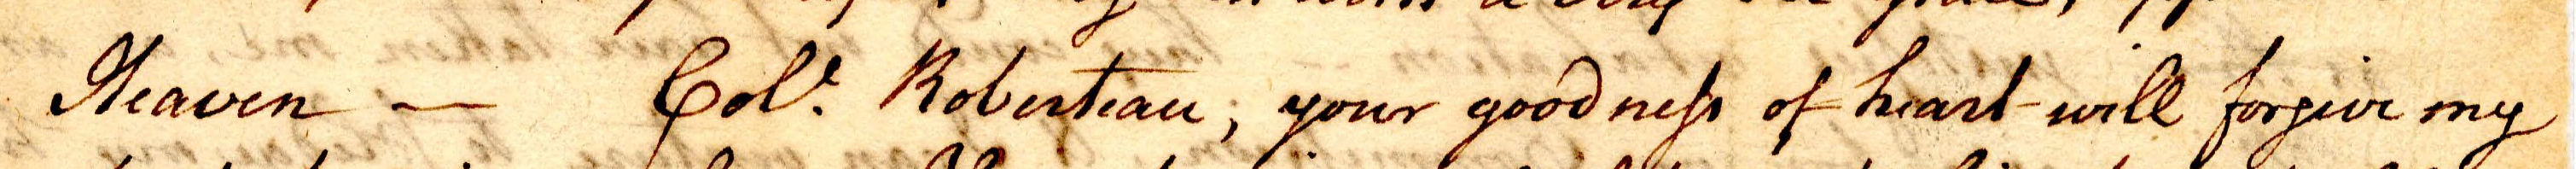Heaven. Col^o. Roberteau; your goodness of heart will forgive my
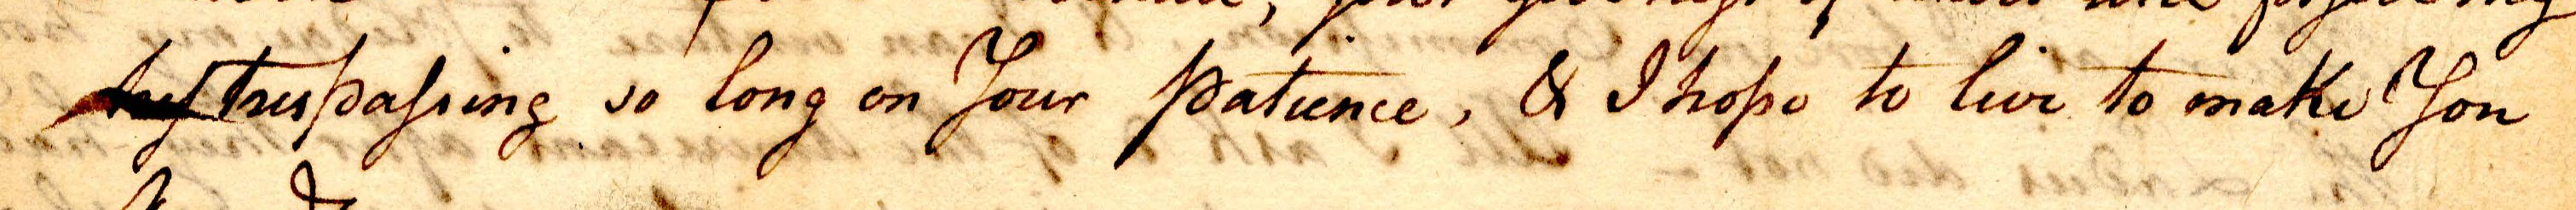by trespassing so long on your patience, & I hope to live to make You
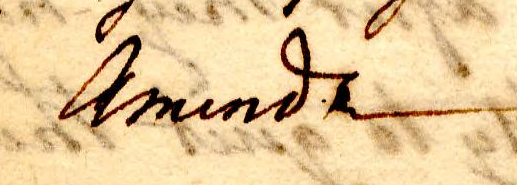Amends
